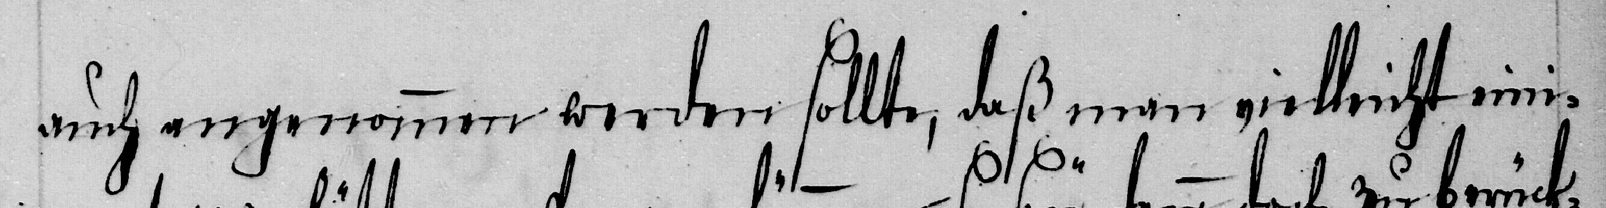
auch angenommen werden sollte, daß man vielleicht eini¬
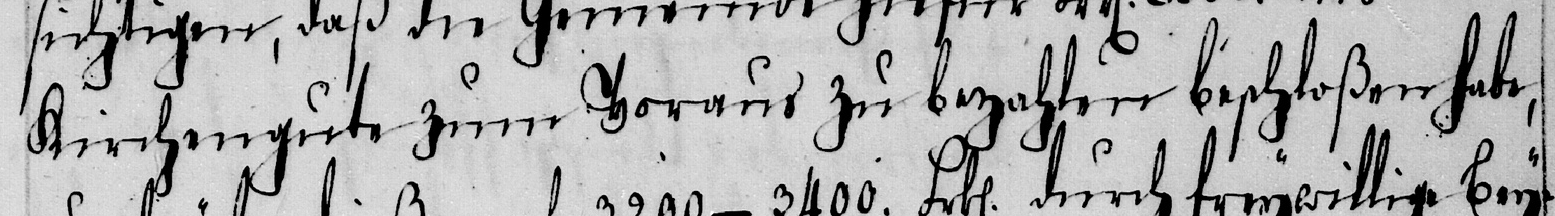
Kirchengute zum Voraus zu bezahlen beschloßen habe,
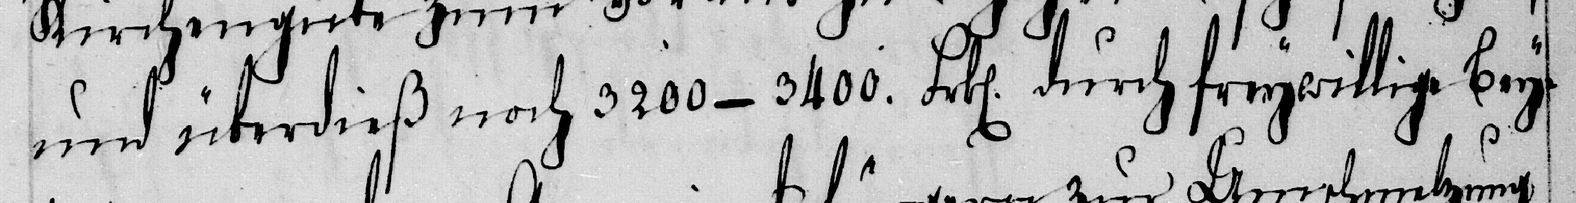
und überdieß noch 3200 – 3400. Frk[en]. durch freywillige Bey¬
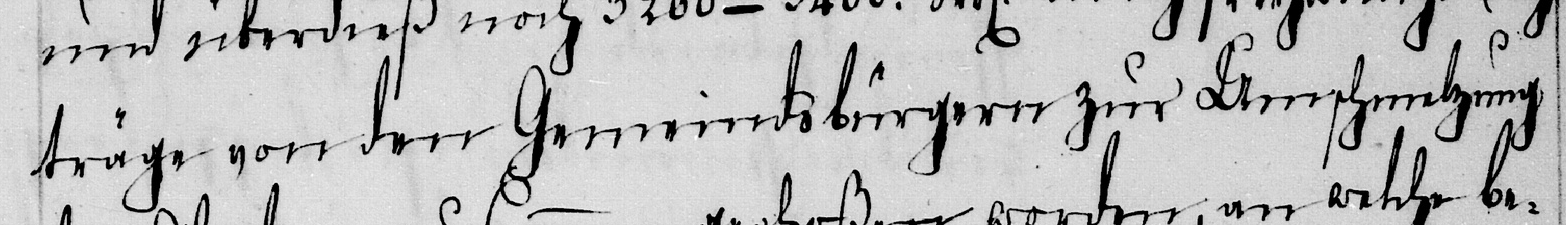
träge von den Gemeindsbürgern zur Umschmelzung
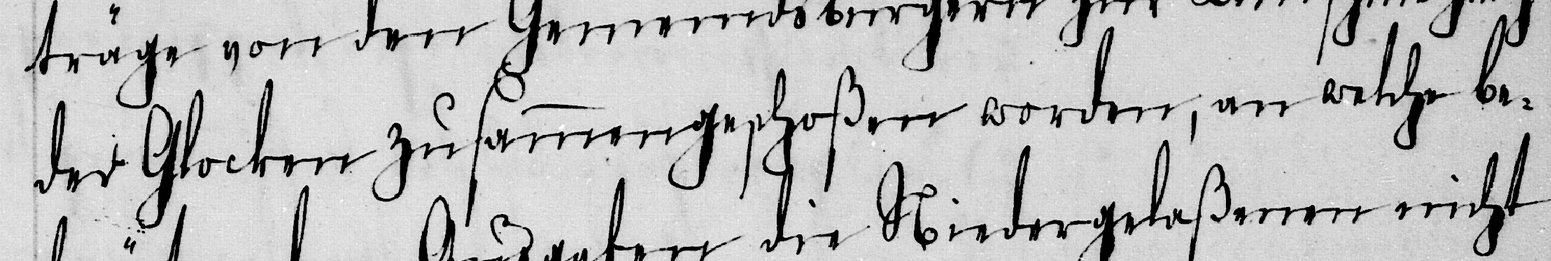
der Glocken zusammengeschoßen worden, an welche be¬
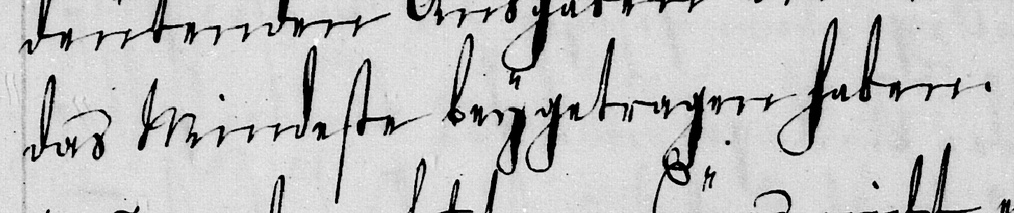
das Mindeste beygetragen haben.
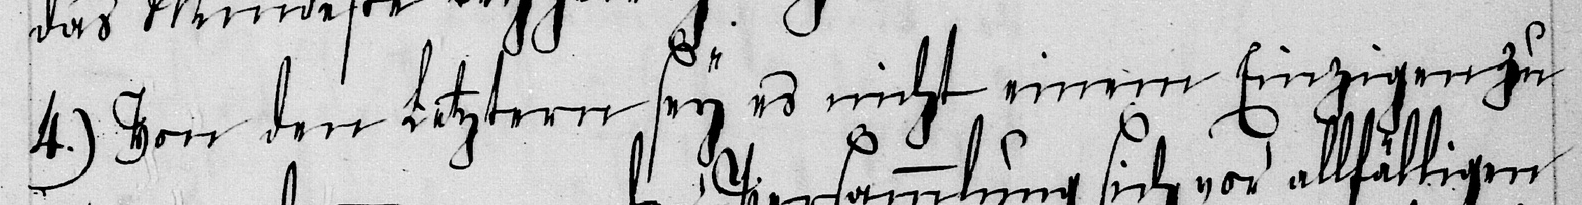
4.) Von den Letztern sey es nicht einem Einzigen zu
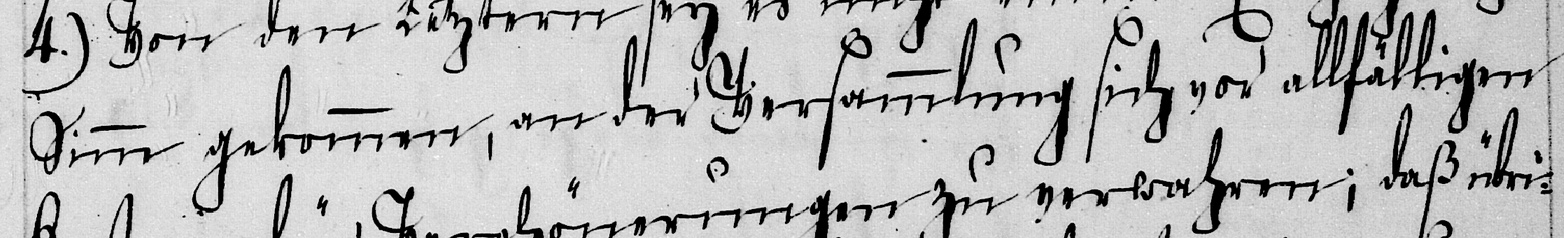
Sinn gekommen, an der Versammlung sich vor allfälligen
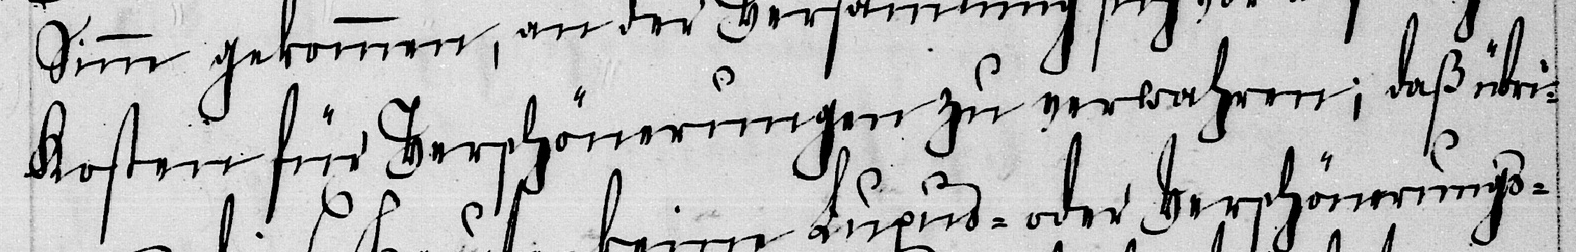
Kosten für die Verschönerungen zu verwehren; daß übri¬
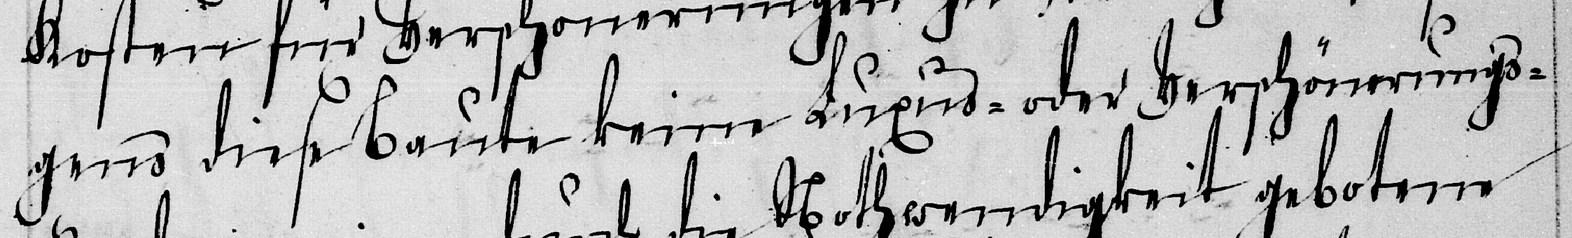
gens diese Baute keine Luxus- oder Verschönerungs-
